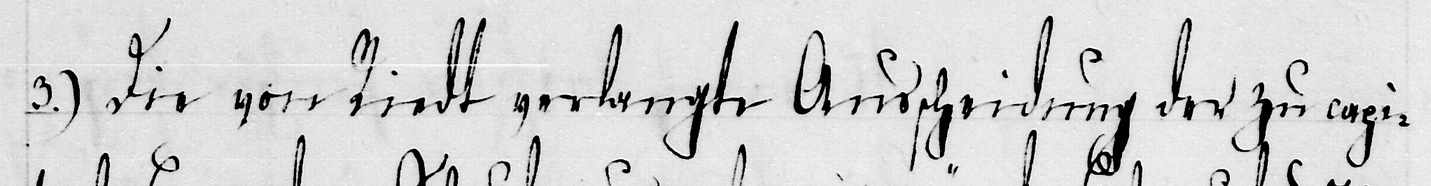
3.) Die von Riedt verlangte Ausscheidung der zu capi¬
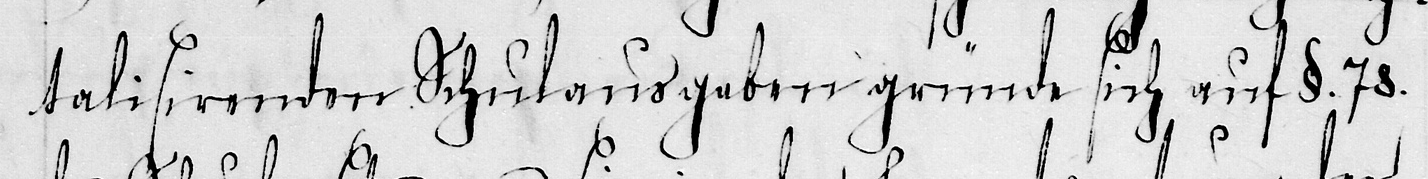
talisirenden Schulausgaben gründe sich auf §. 78.
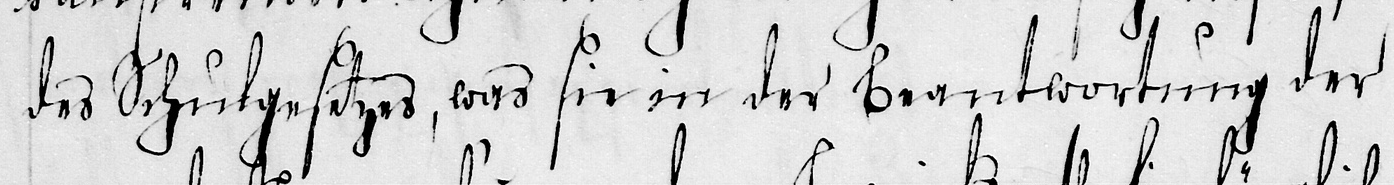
des Schulgesetzes, was sie in der Beantwortung der
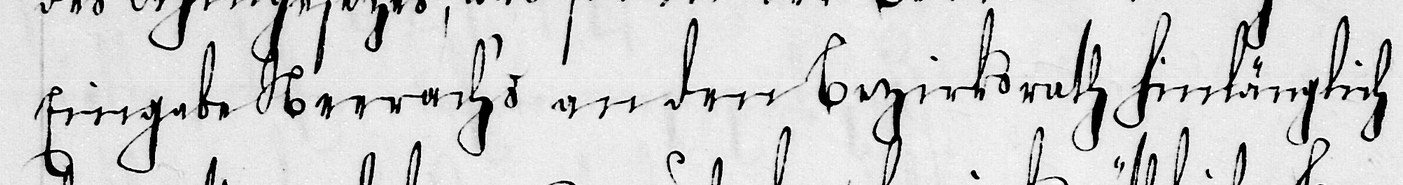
Eingabe Neerach’s an den Bezirksrath hinlänglich
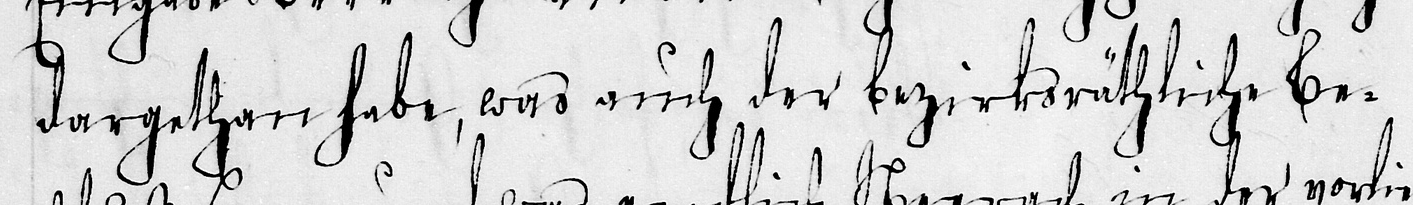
dargethan habe, was auch der bezirksräthliche Be¬
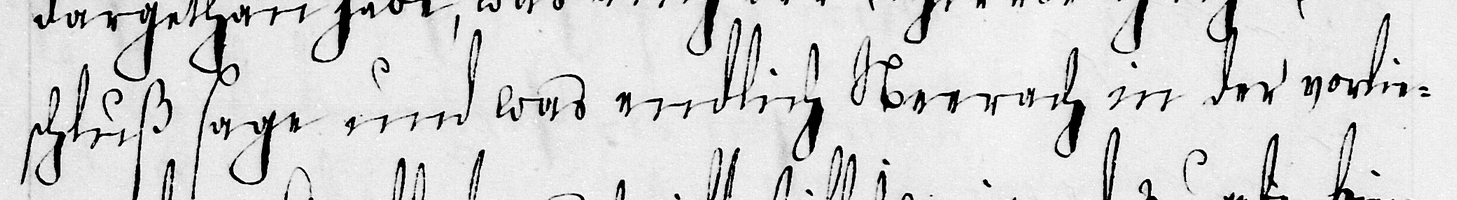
schluß sage und was endlich Neerach in der vorlie¬
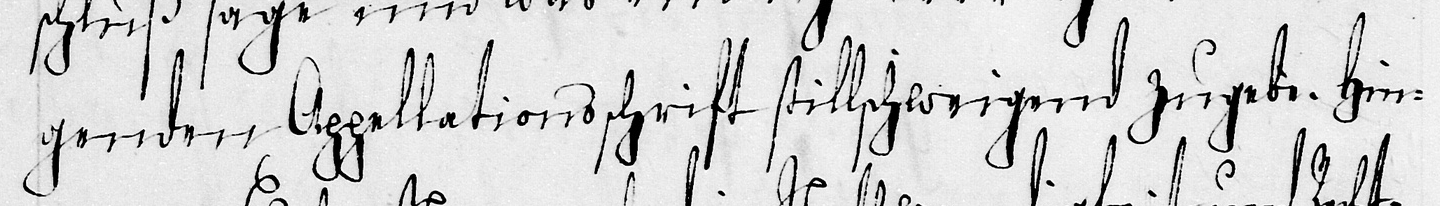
genden Appellationsschrift stillschweigend zugebe. Hin¬
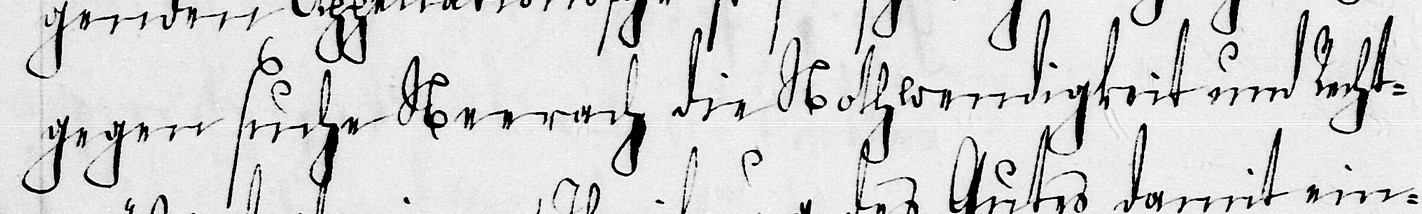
gegen suche Neerach die Nothwendigkeit und Recht¬
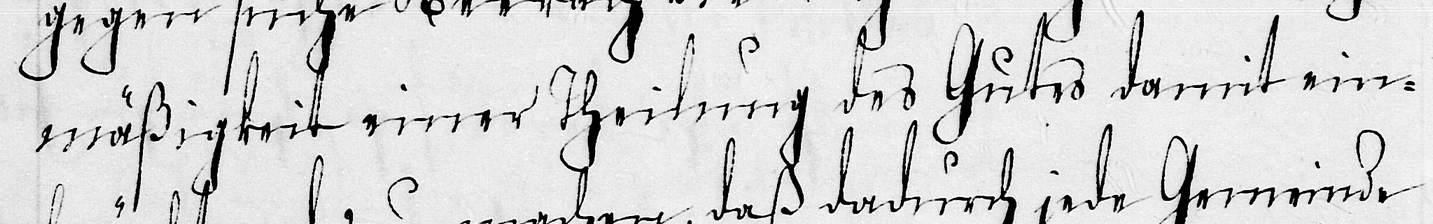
mäßigkeit einer Theilung des Gutes damit ein¬
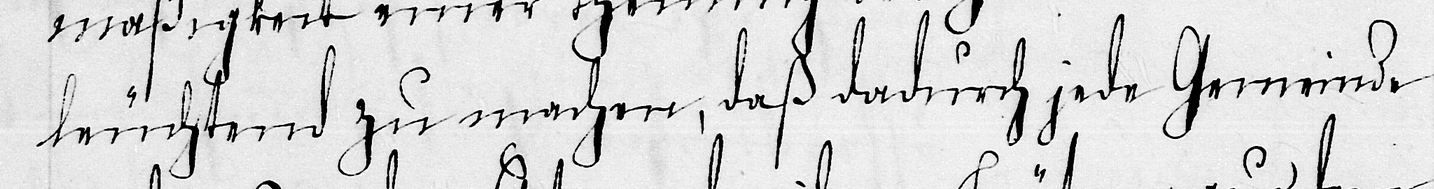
leuchtend zu machen, daß dadurch jede Gemeinde
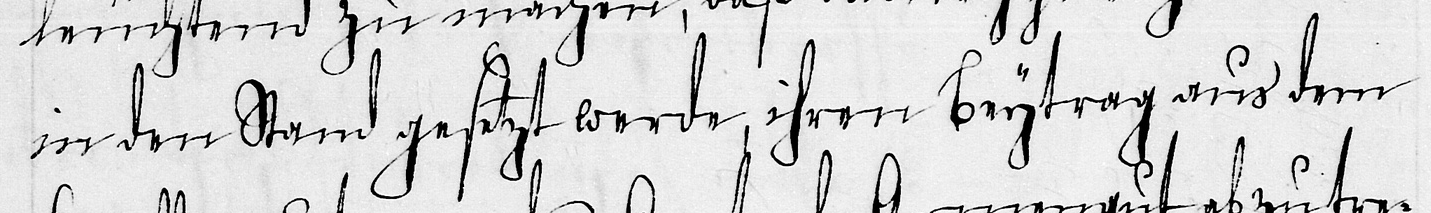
in den Stand gesetzt werde, ihren Beytrag aus dem
